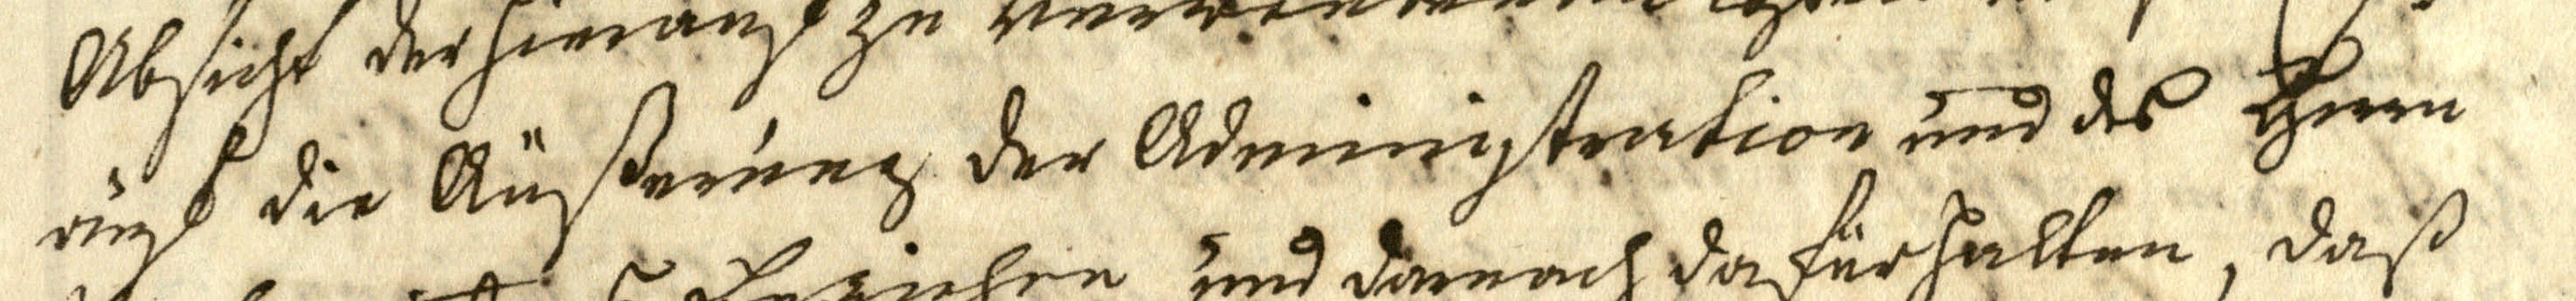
auf die Äußerung der Administration und des Herrn
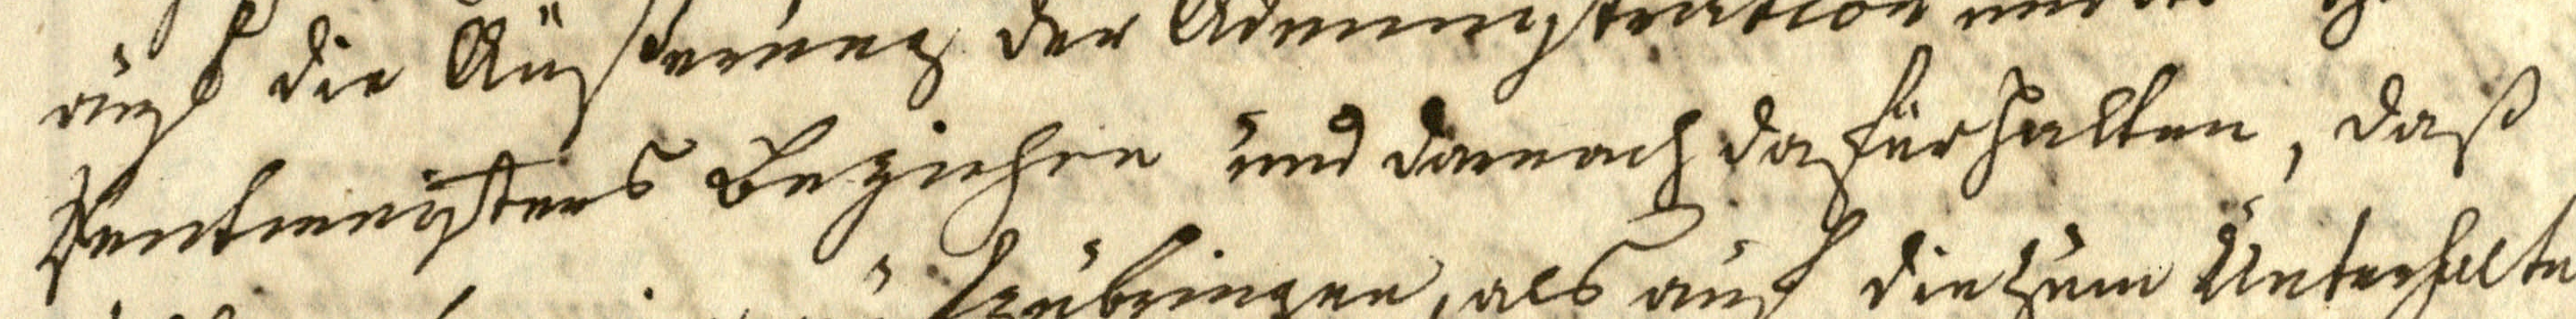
Rentmeisters beziehen und darnach dafürhalten, daß
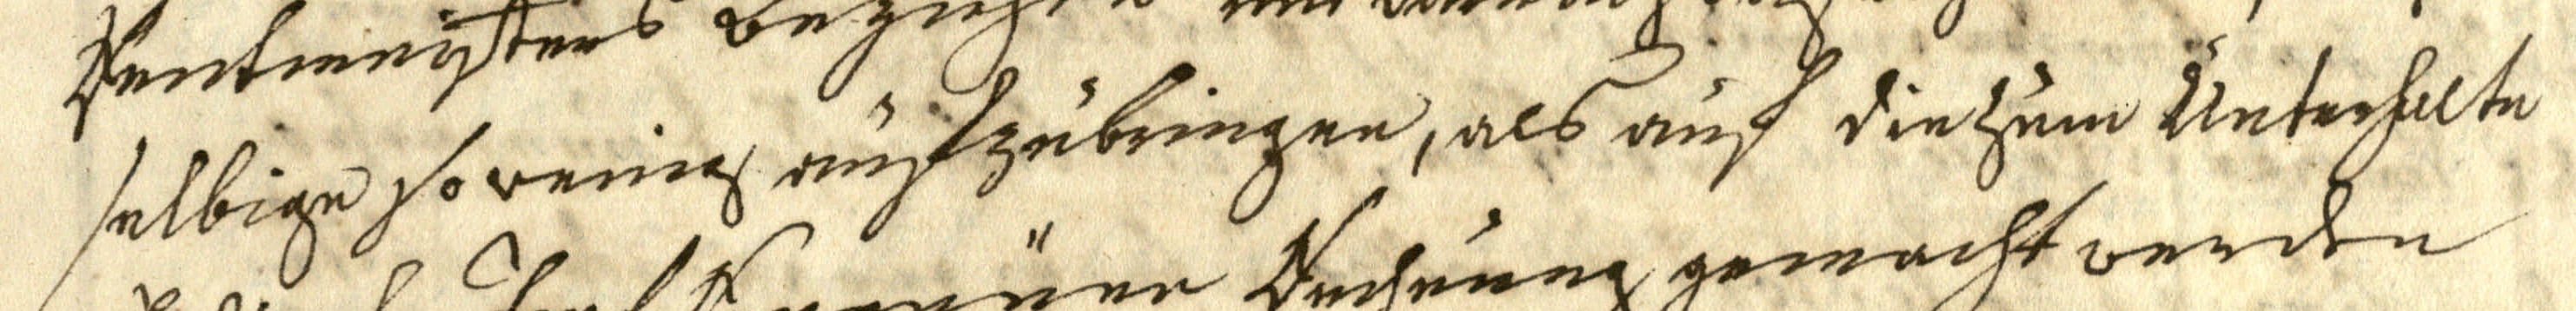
selbige so wenig aufzubringen, als auf die zum Unterhalte
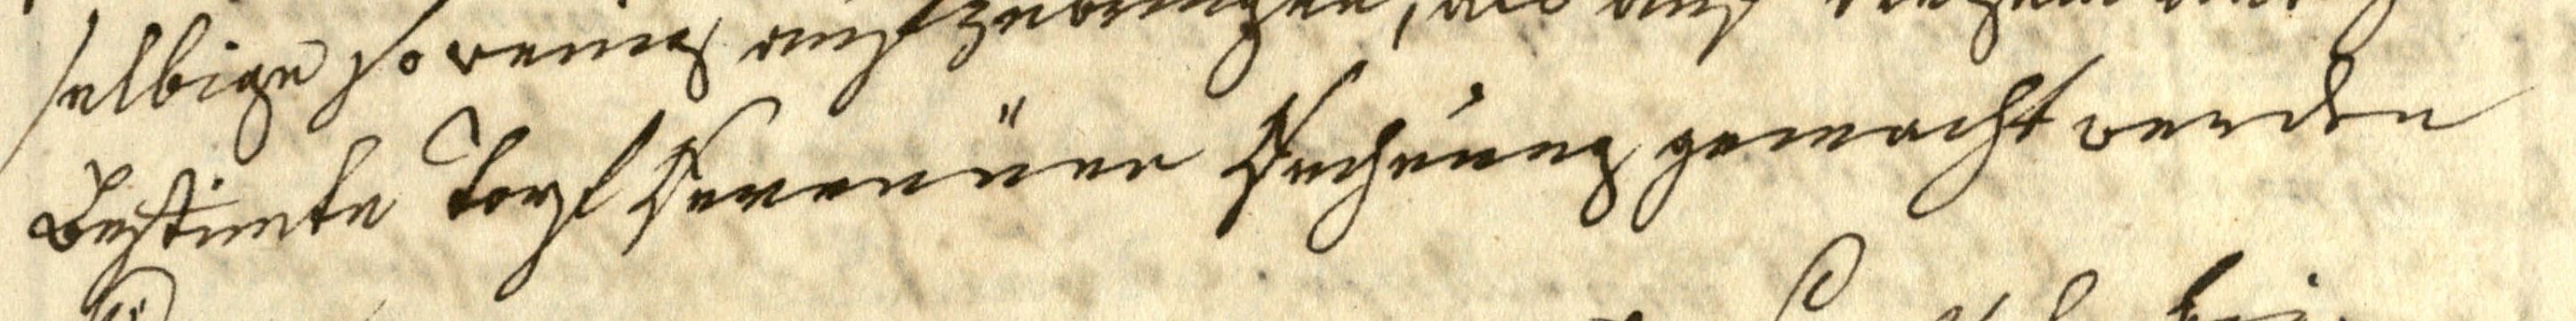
bestimte Torf Revenuen Rechnung gemacht werden
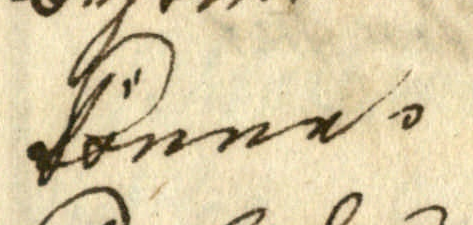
könne.
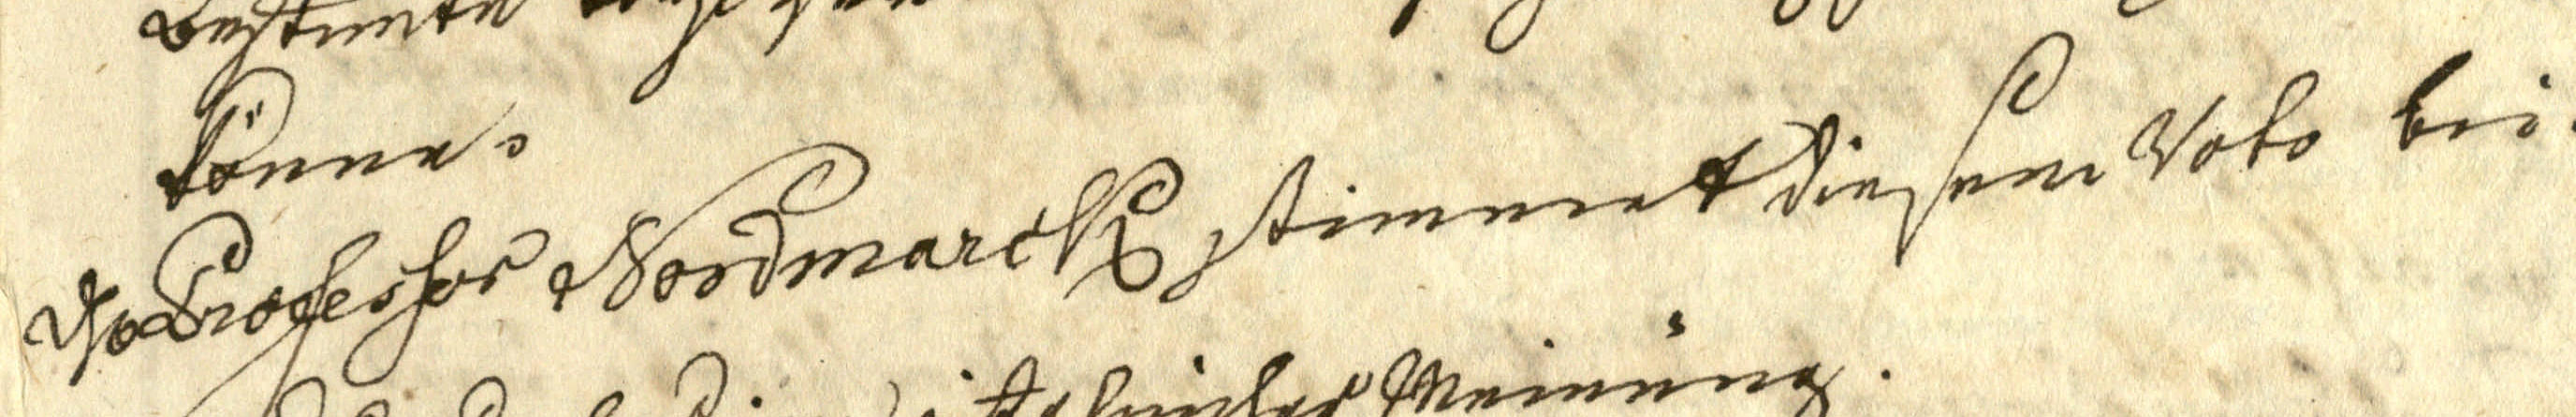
dh Professor Nordmarck stimmet diesem Voto bei.
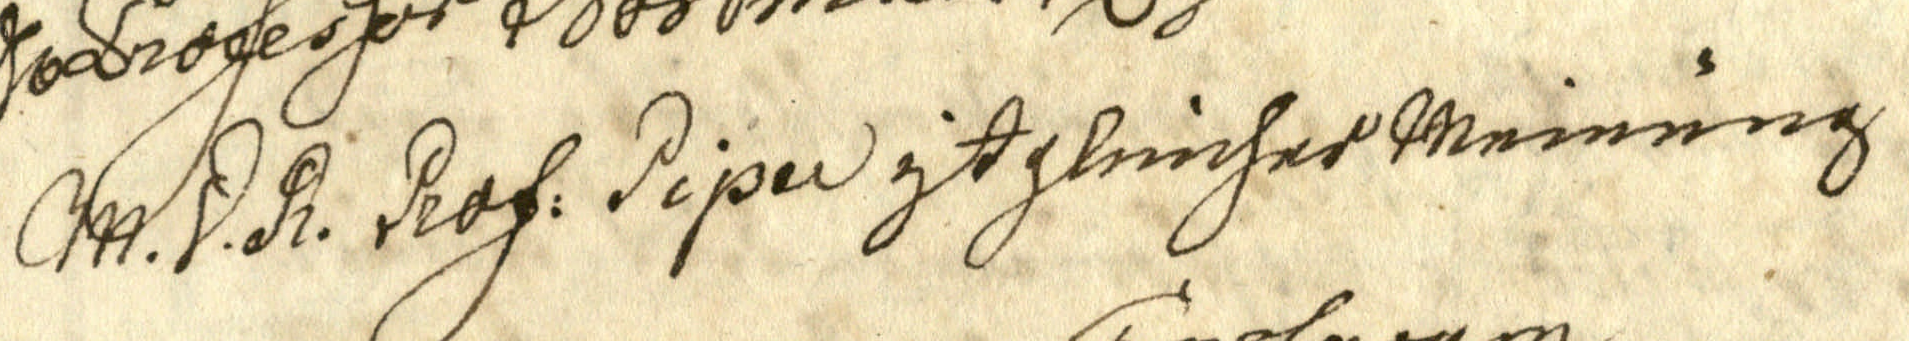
M.D.R. Prof. Piper ist gleicher Meinung.
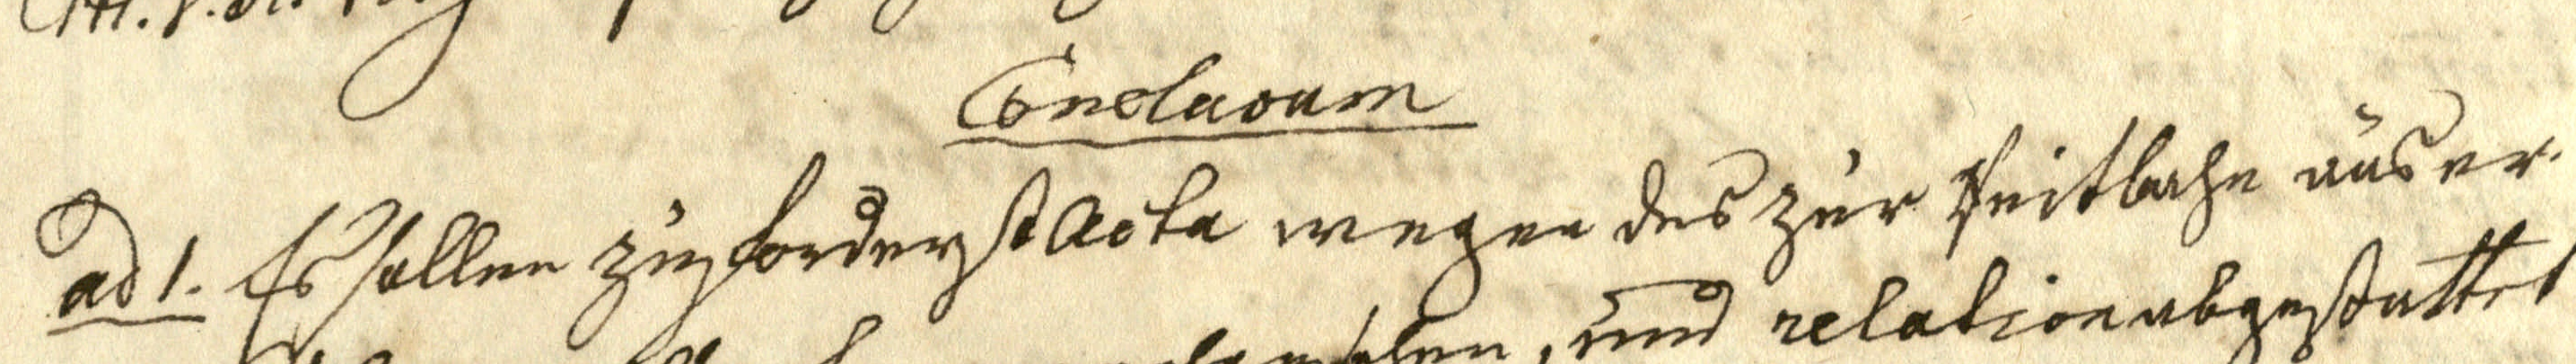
ad 1. Es sollen zuforderst Acta wegen des zur Reitbahn auser¬
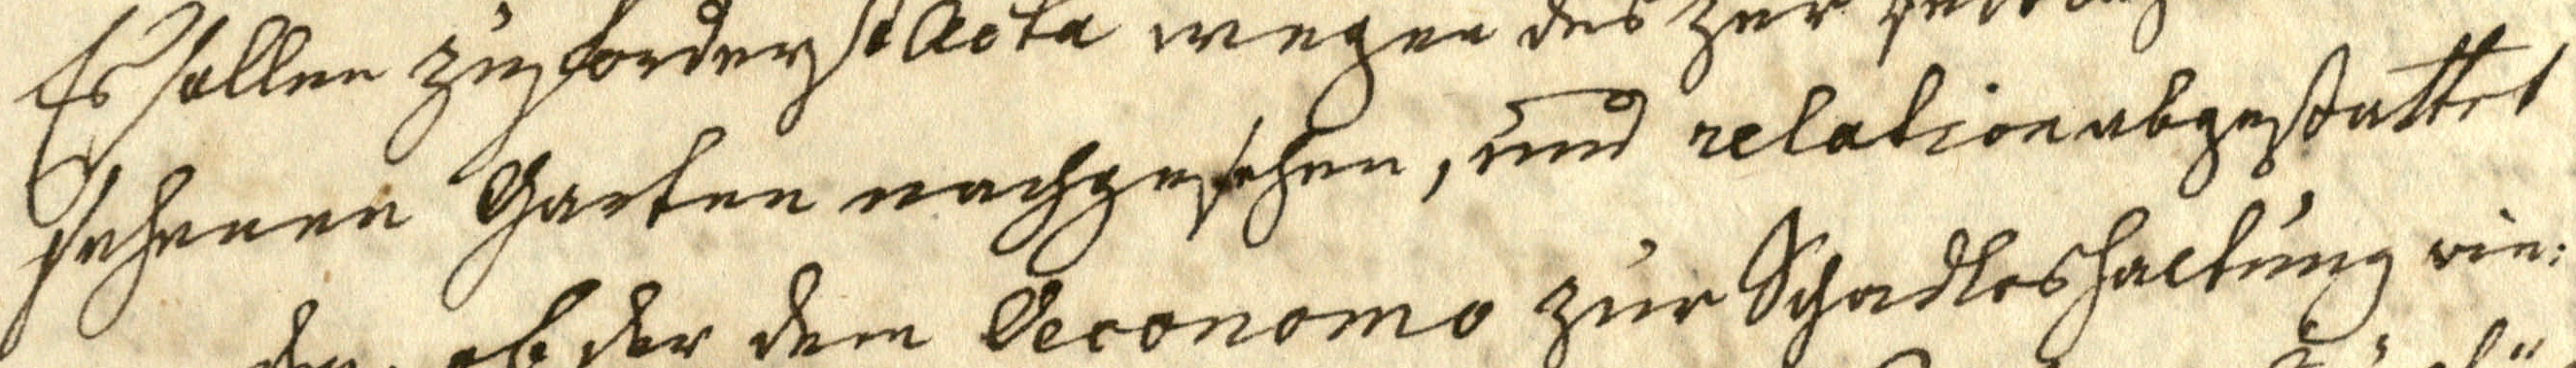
sehenen Garten nachgesehen, und relation abgestattet
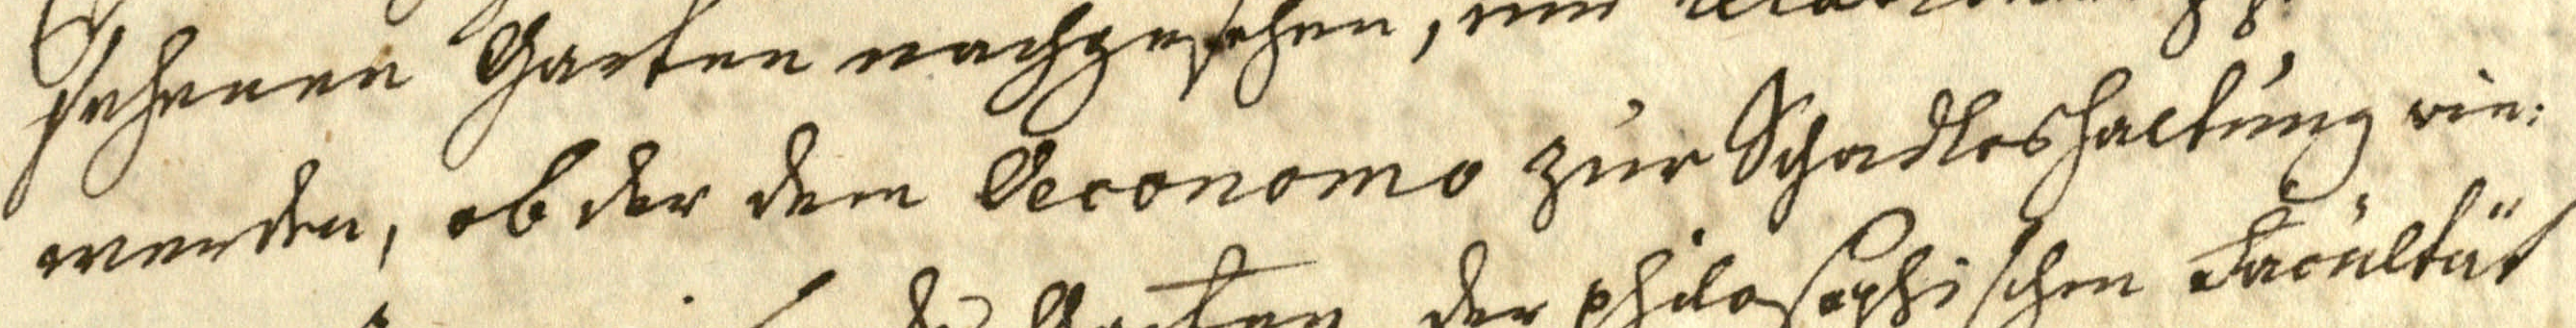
werden, ob der dem Oeconomo zur Schadloshaltung wie¬
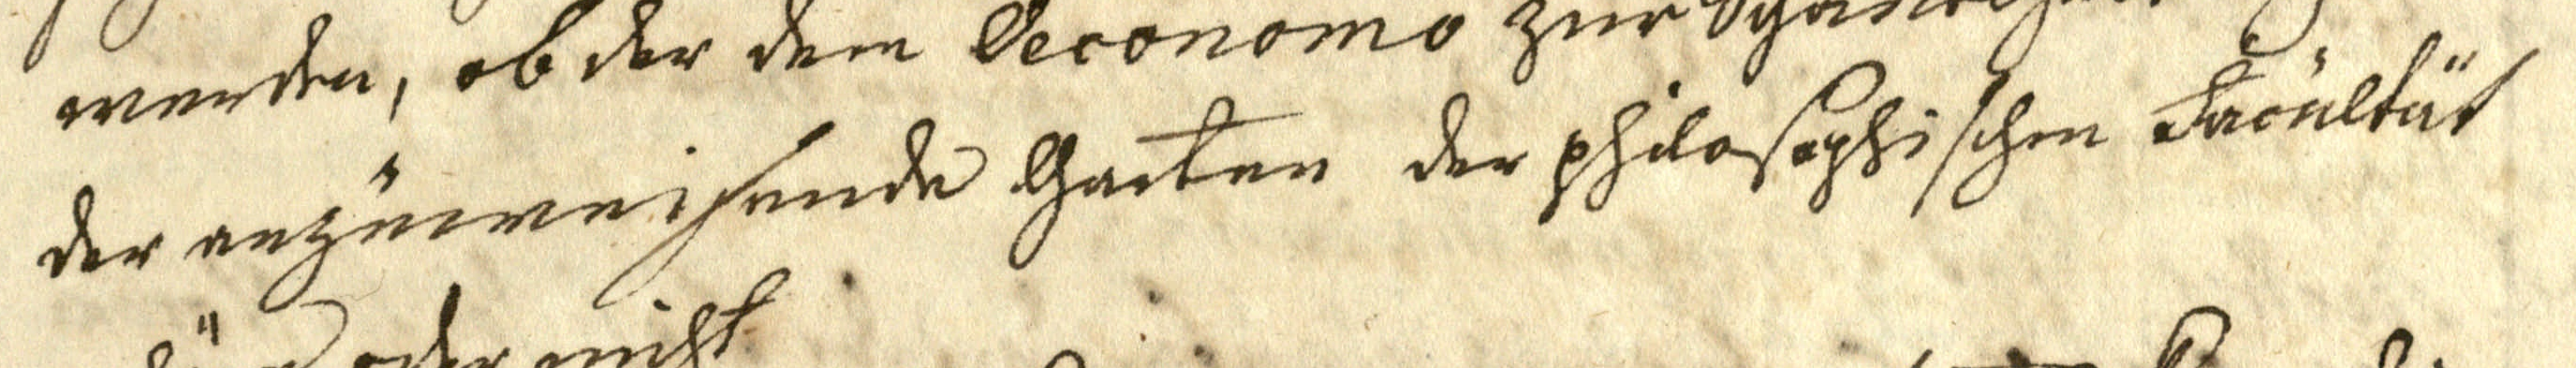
der eizuweisende Garten der philosophischen Facultät
